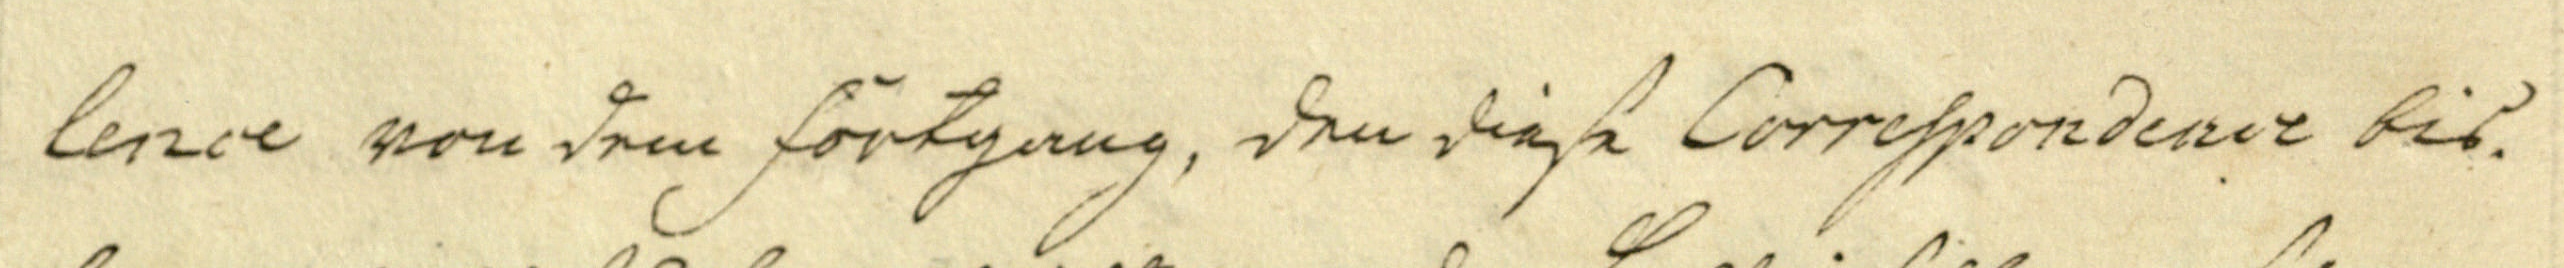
lence von dem Fortgang, den diese Correspondence bis¬
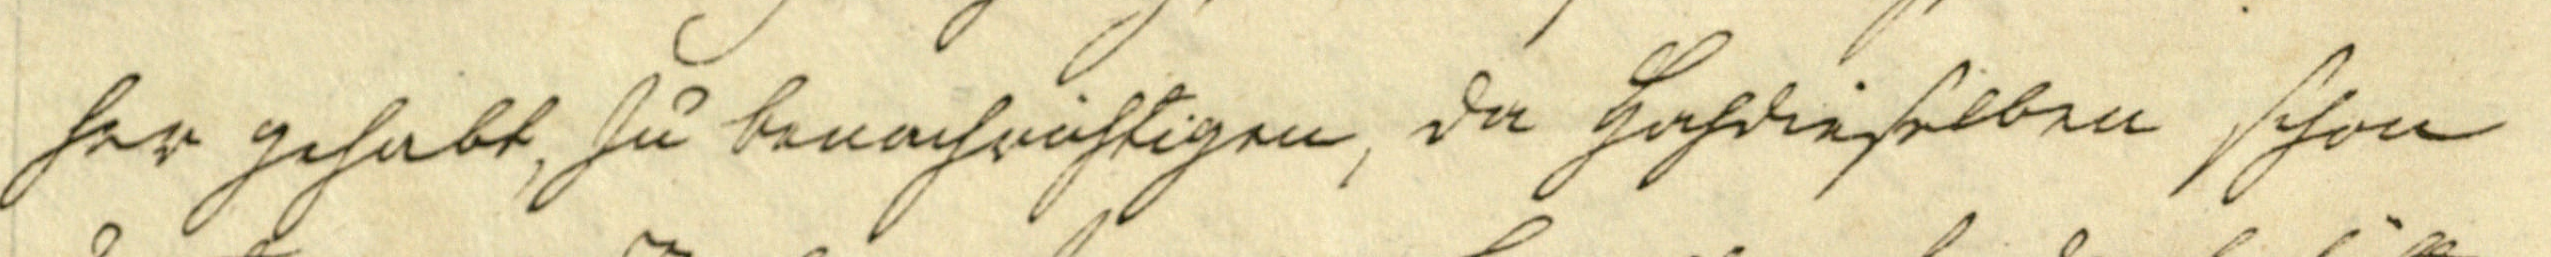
her gehabt, zu benachrichtigen, da Hochdieselben schon
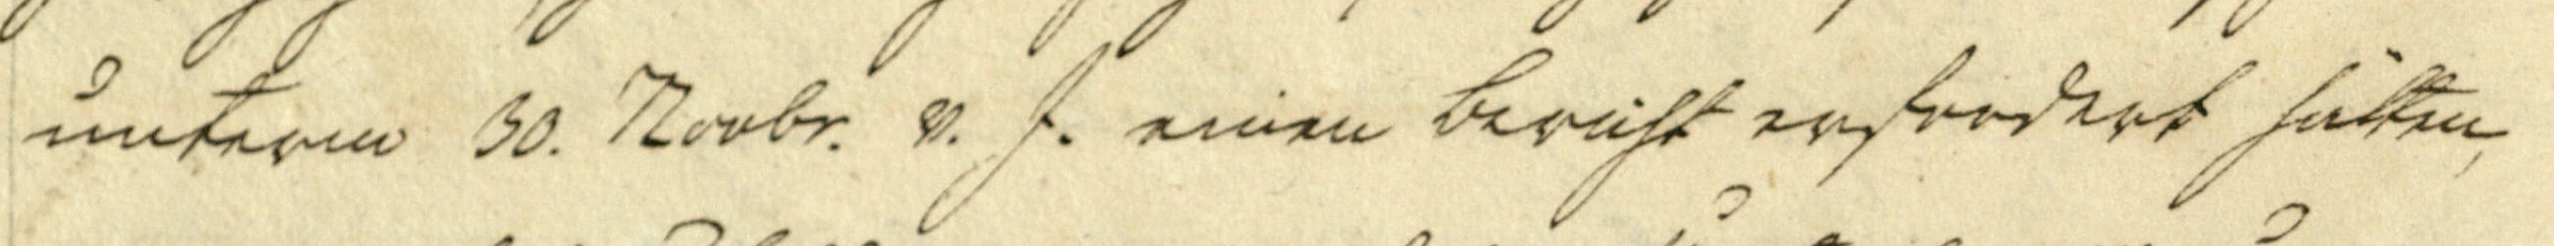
unterm 30. Novbr. v. J. einen Bericht erfordert hätten,
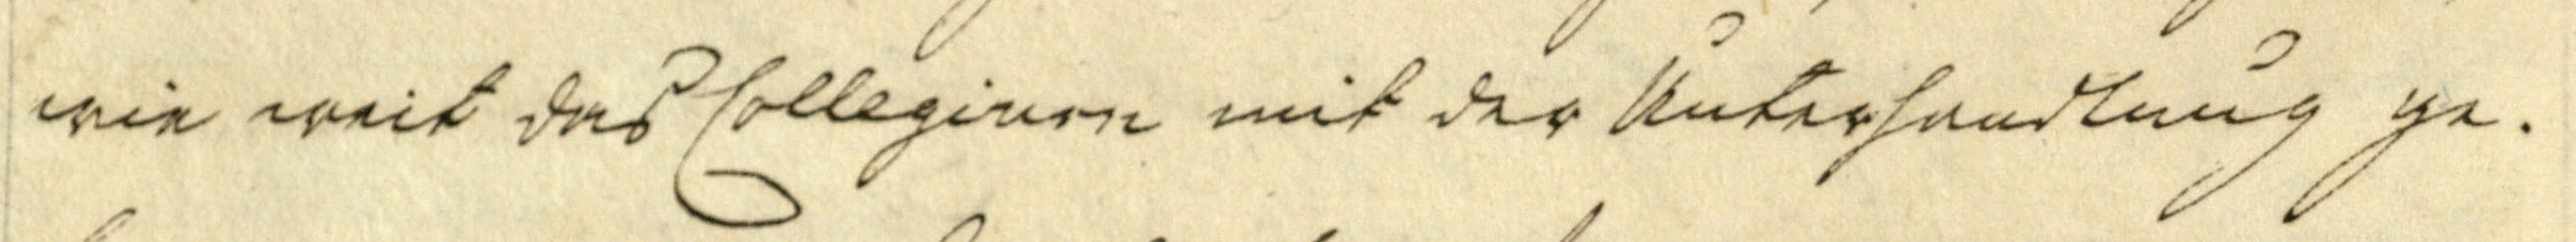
wie weit das Collegium mit der Unterhandlung ge¬
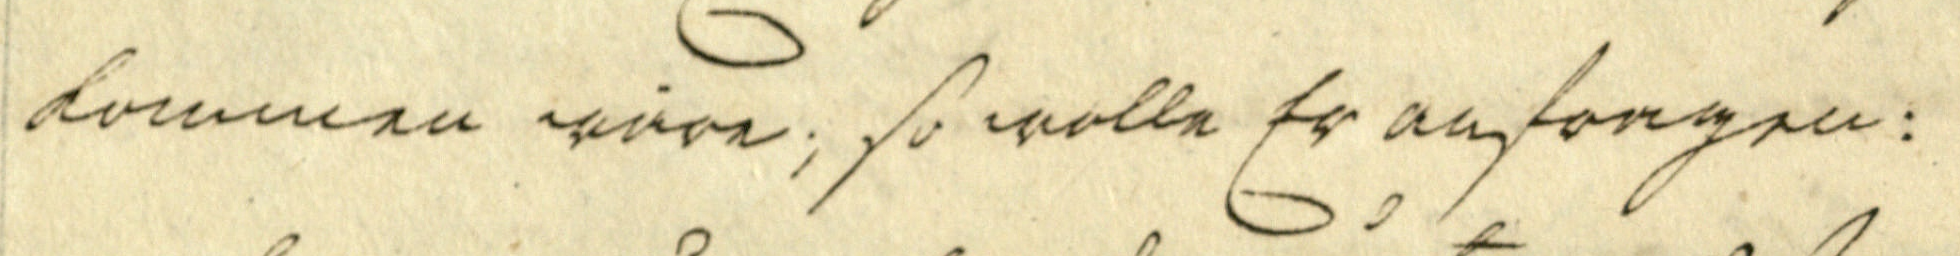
kommen wäre; so wolle Er anfragen:
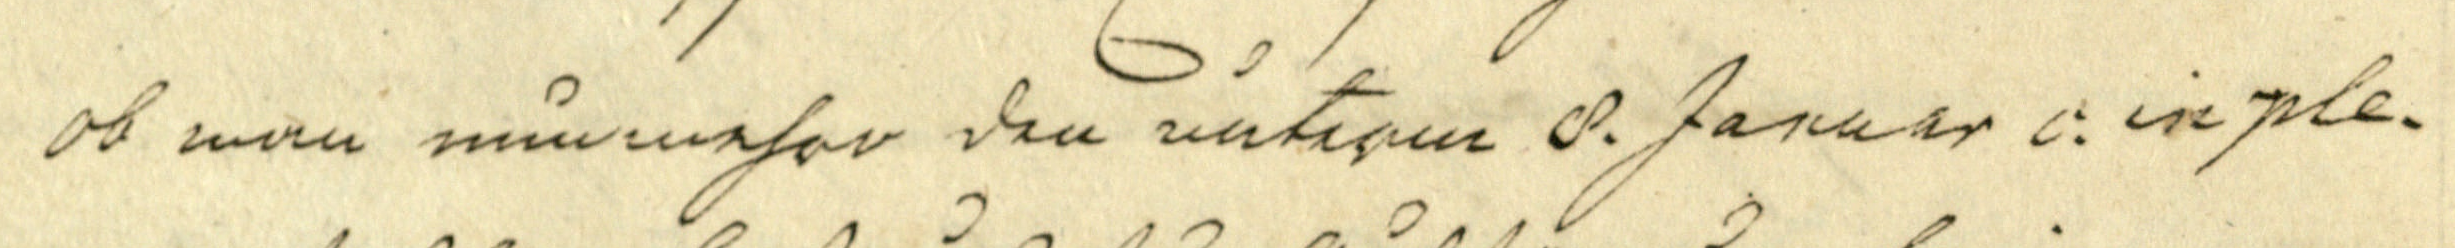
ob man nunmehr den unterm 8. Januar c. in ple¬
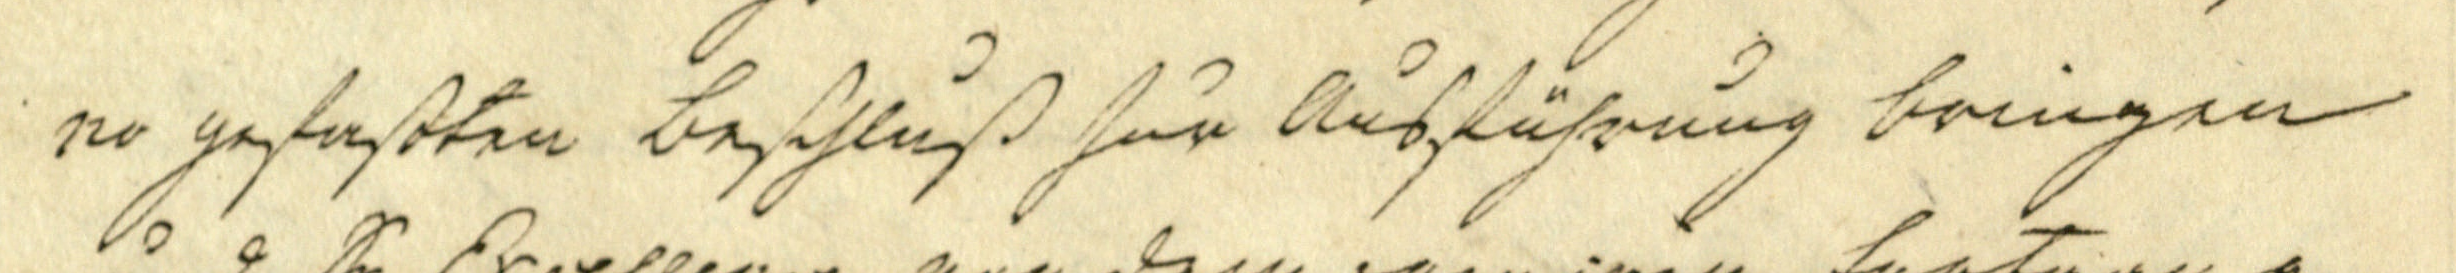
no gefaßten Beschluß zur Ausführung bringen
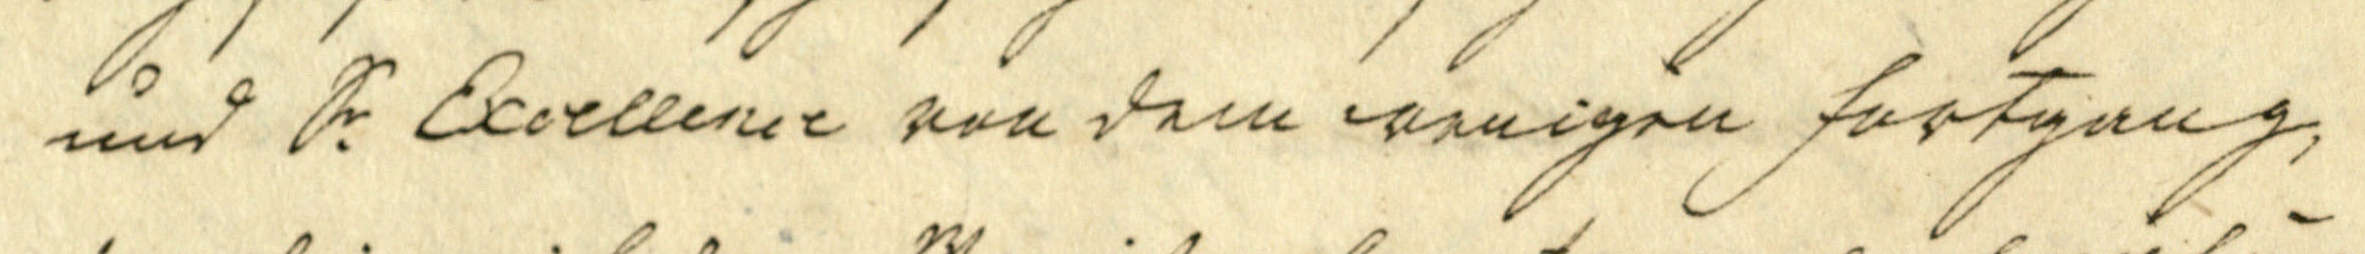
und Sr Excellence von dem wenigen Fortgang,
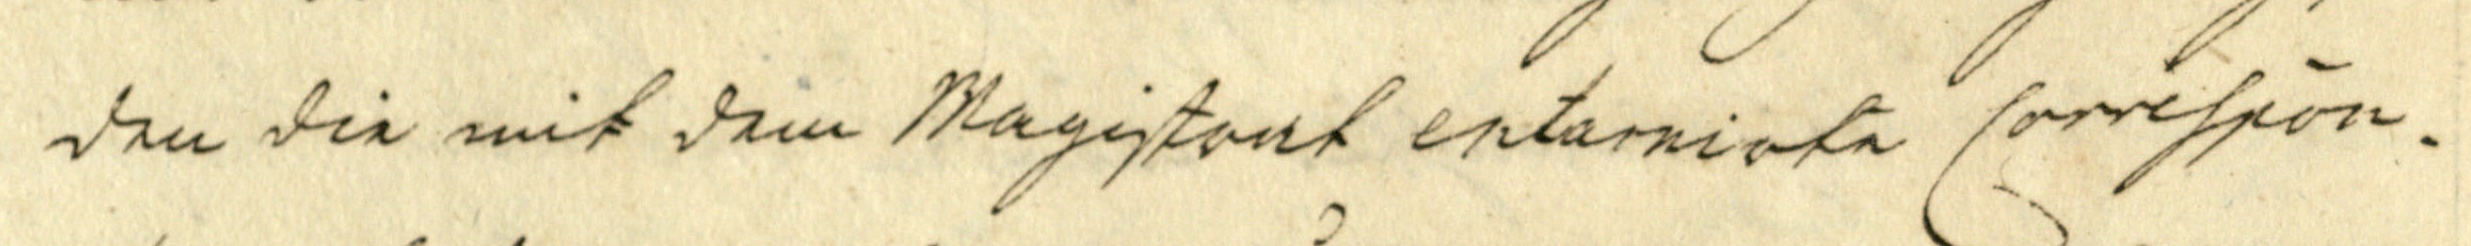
den die mit dem Magistrat entamirte Correspon¬
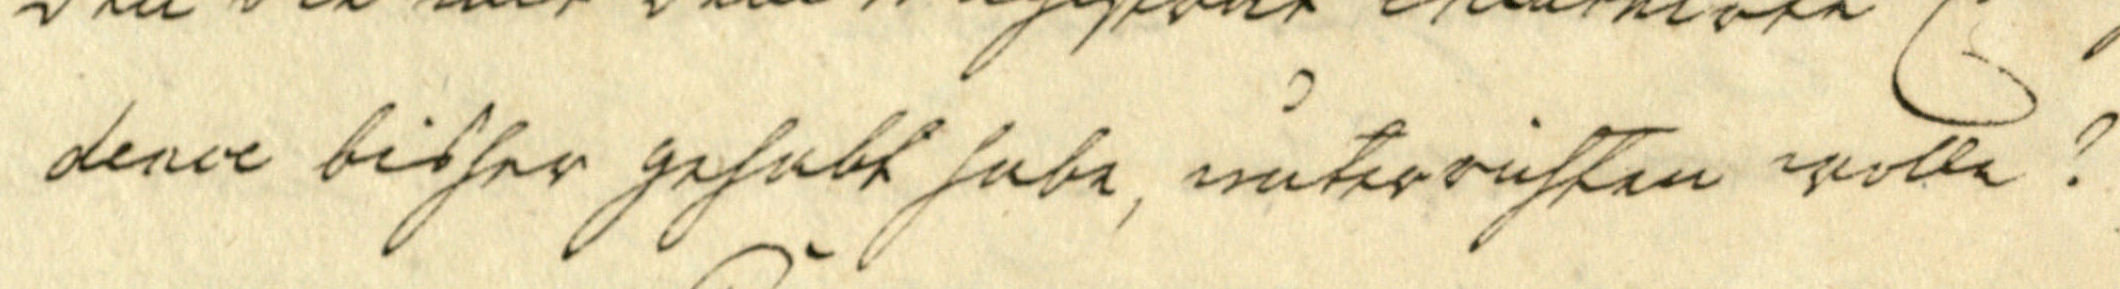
dence bisher gehabt habe, unterrichten wolle?
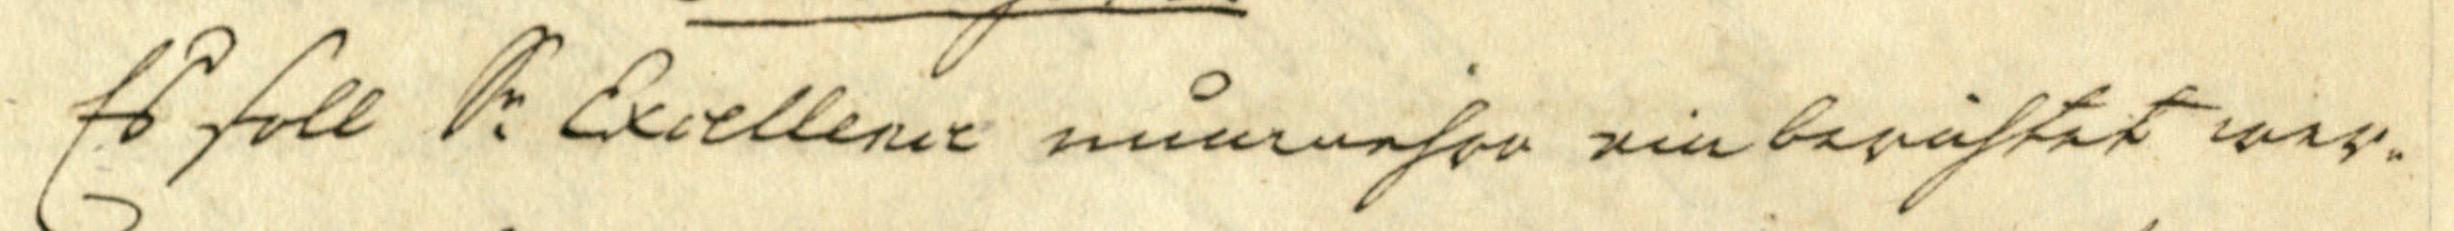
Es soll Sr Excellence nunmehro einberichtet wer¬
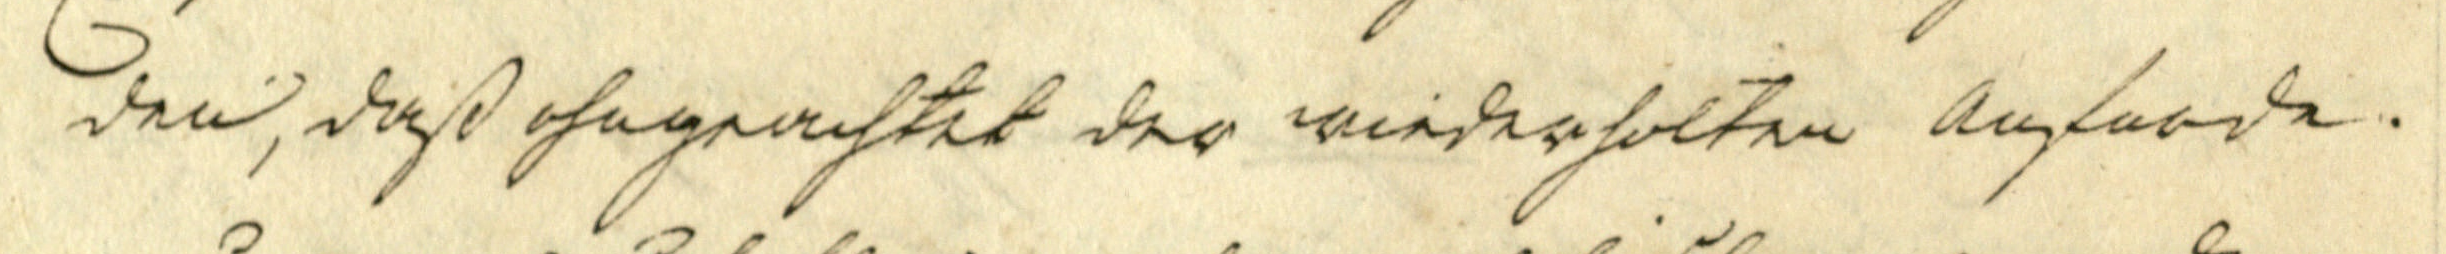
den, daß ohngeachtet der wiederholten Anforde¬
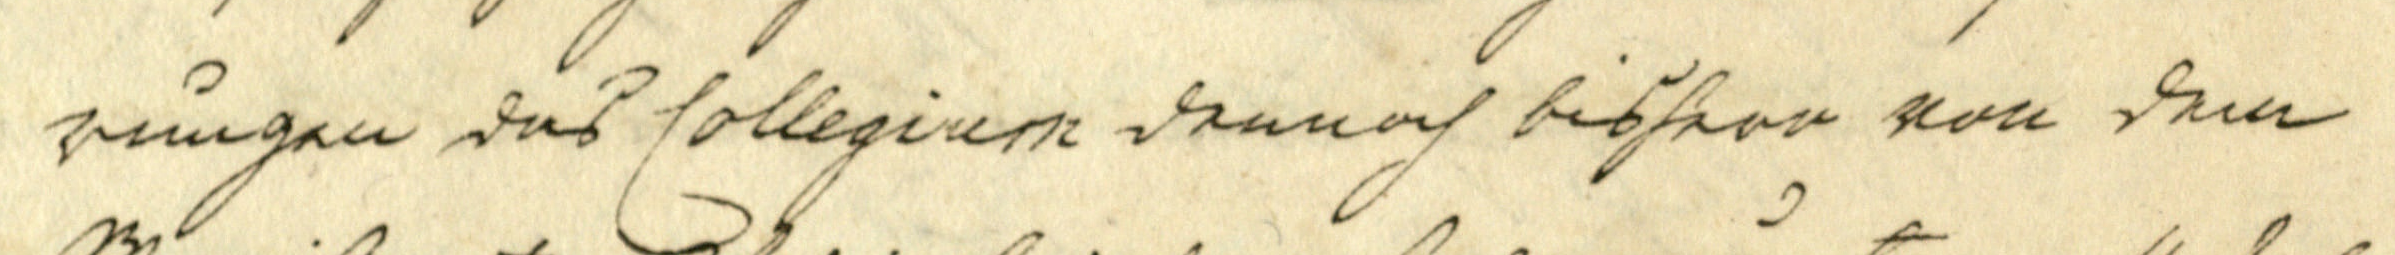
rungen das Collegium dennoch bisherr von dem
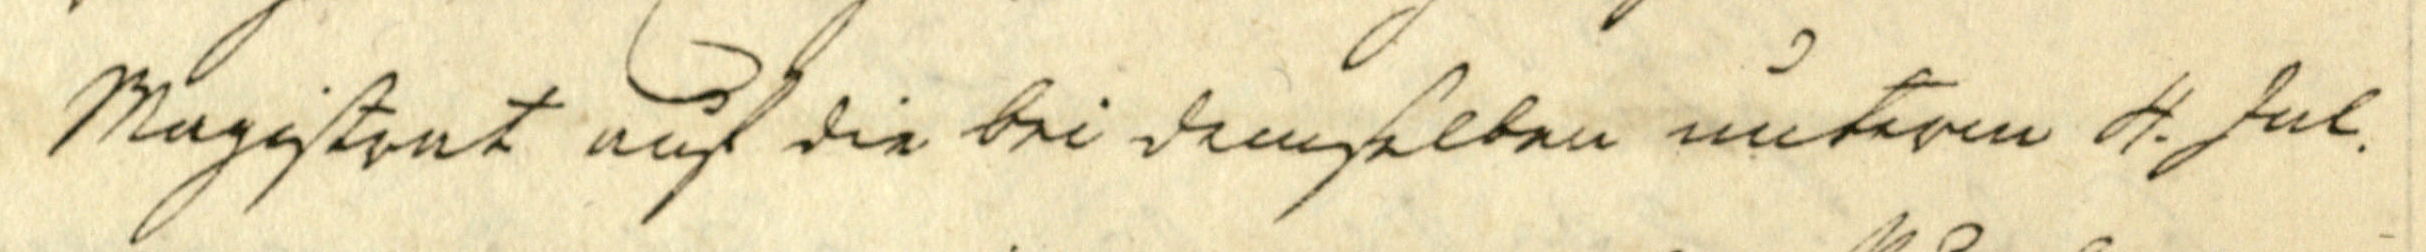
Magistrat auf die bei demselben unterm 4. Jul.
